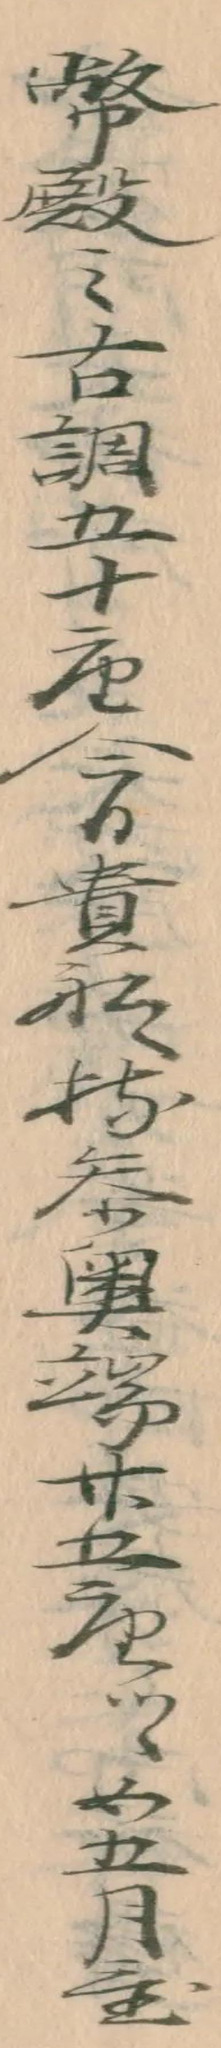一幣殿之古調五十座今日貴舩へ持参奥端廿五座ツヽ如五月置
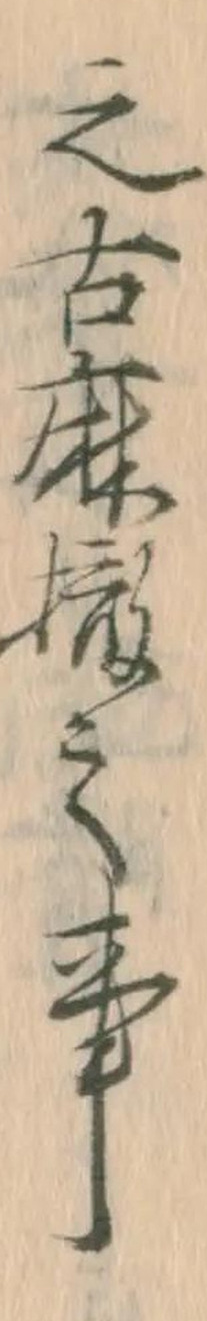之古麻撤之事
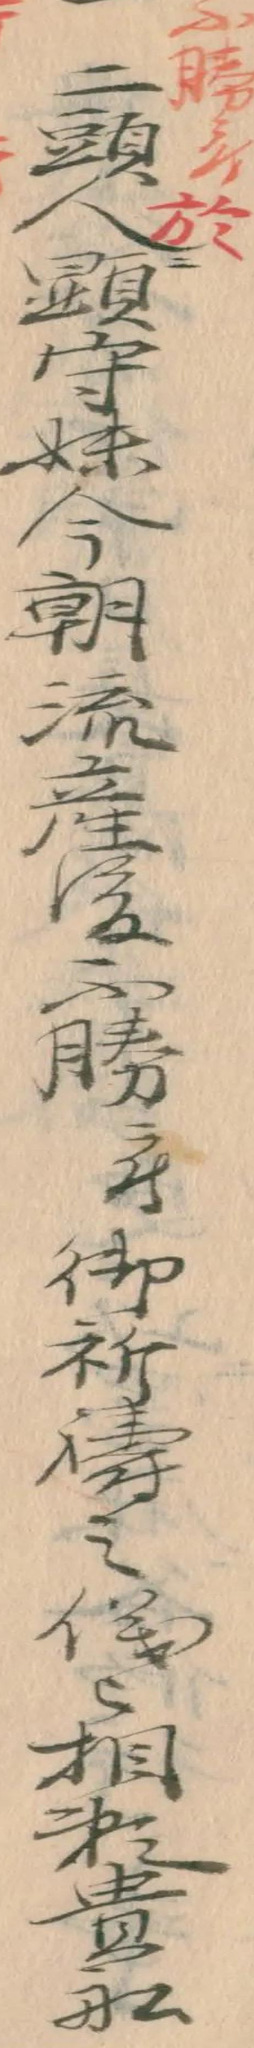一二頭人顕守妹今朝流産後不勝ニ付御祈祷之儀被相頼貴舩
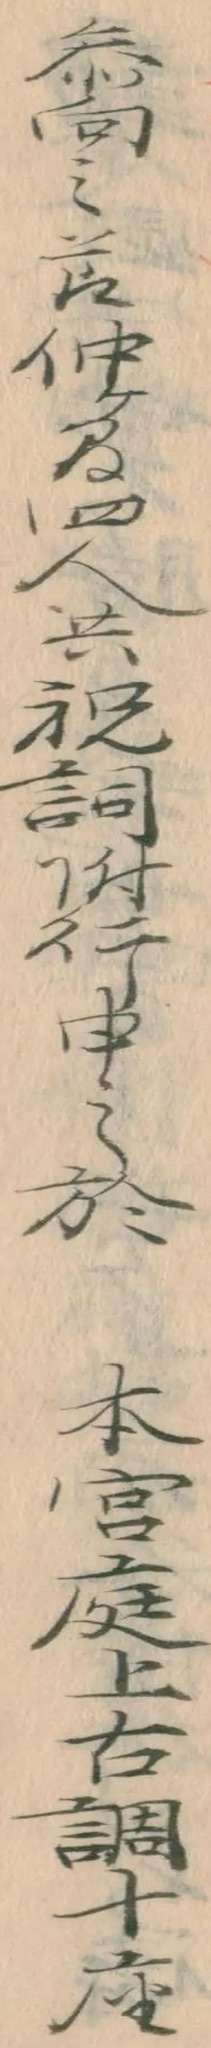参向之節仲ヶ間四人共祝詞附行申之於本宮庭上古調十座
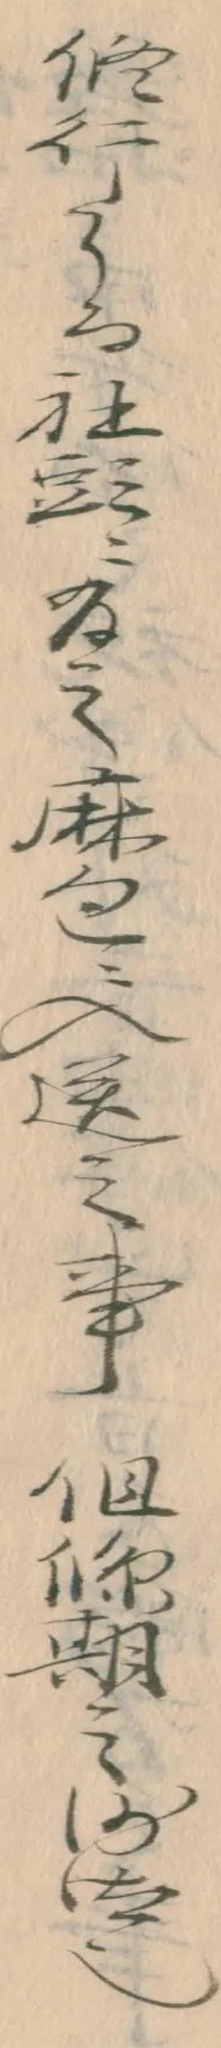修行了而社頭ニ有之麻包ニ入送之事但條期之沙汰也
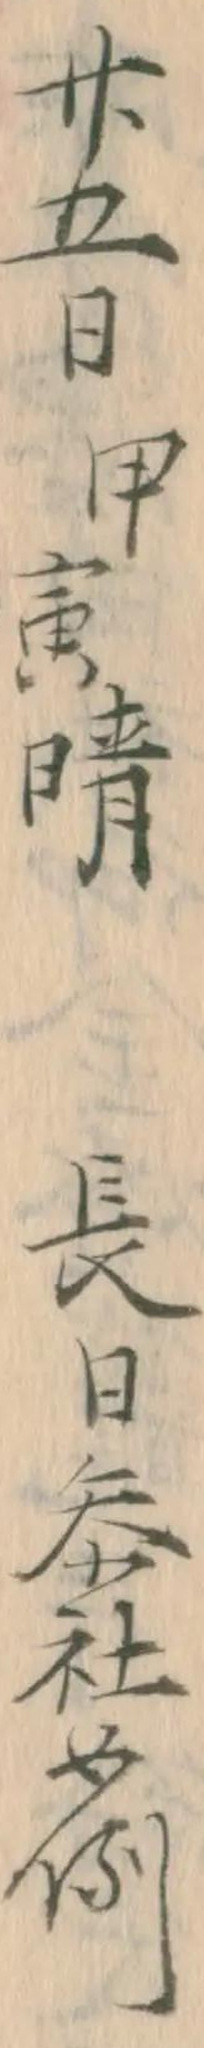廿五日甲寅晴長日参社如例
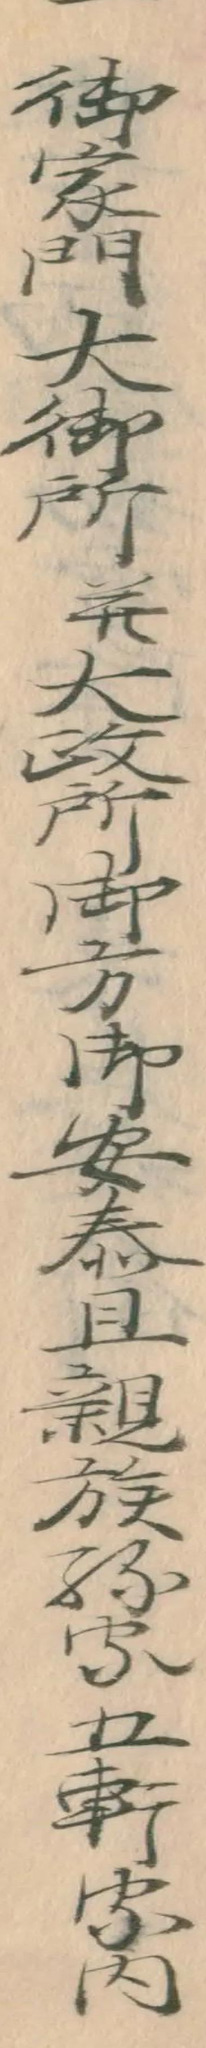一御家門大御所并大政所御方御安泰且親族縁家五軒家内
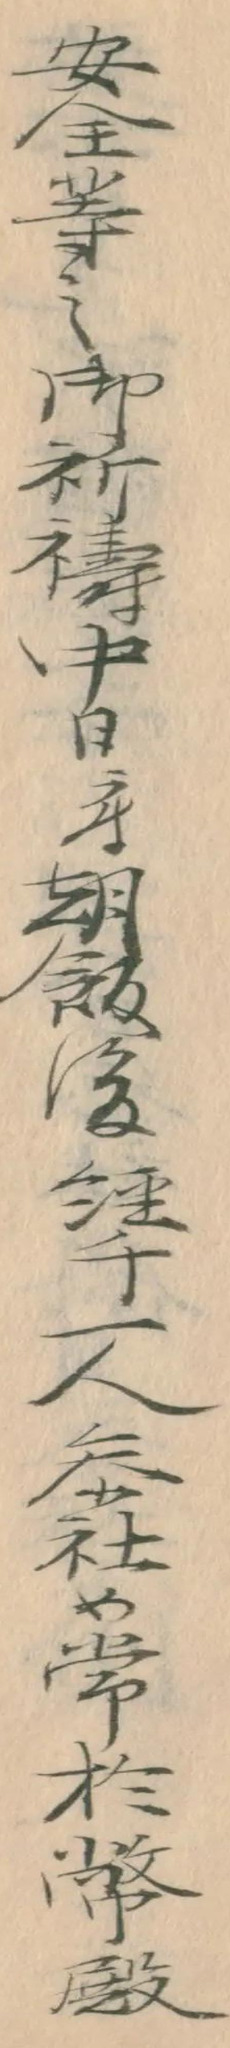安全等之御祈祷中日ニ付朝飯後経千一人参社如常於幣殿
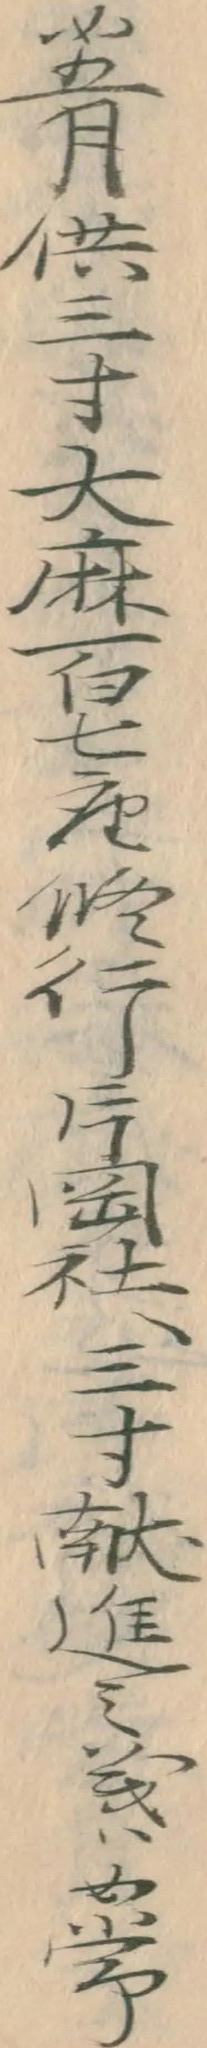如五月供三寸大麻百七座修行片岡社へ三寸献進之義ハ如常

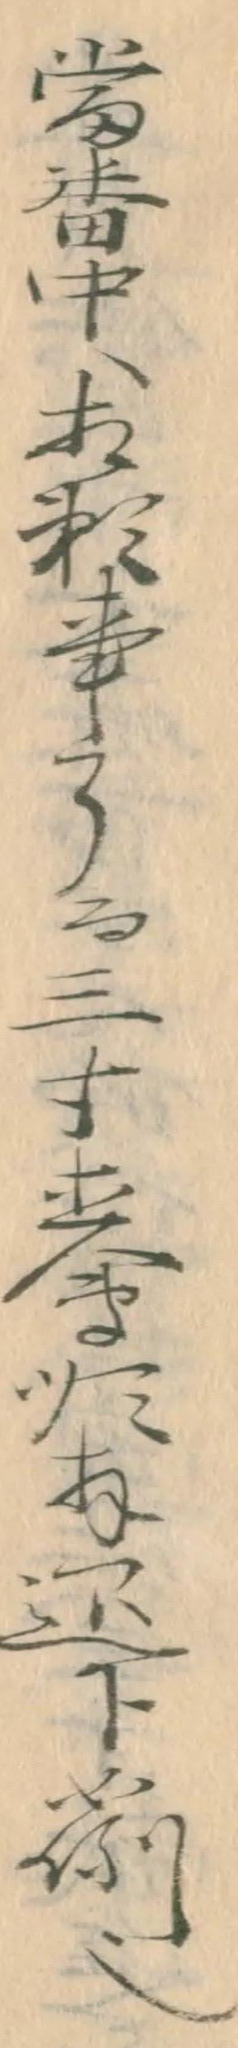當番中へ相頼事了而三寸直會順拝退下如例也
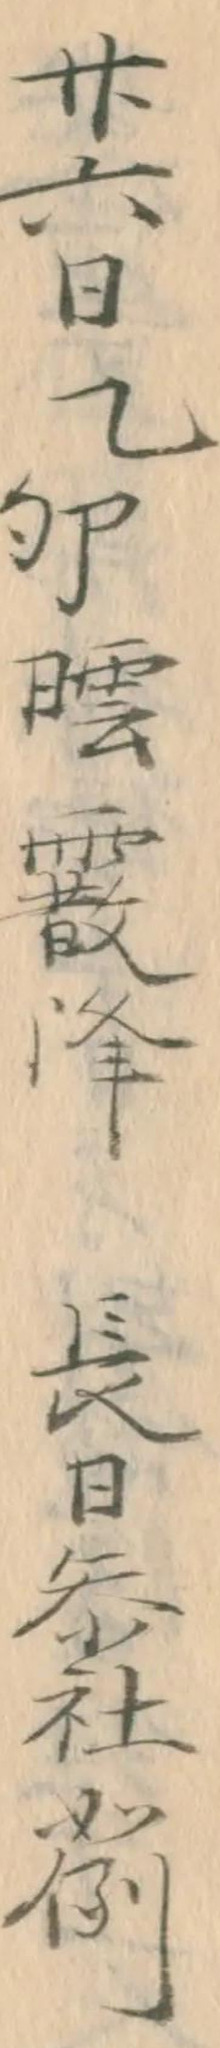廿六日乙卯曇霰降長日参社如例
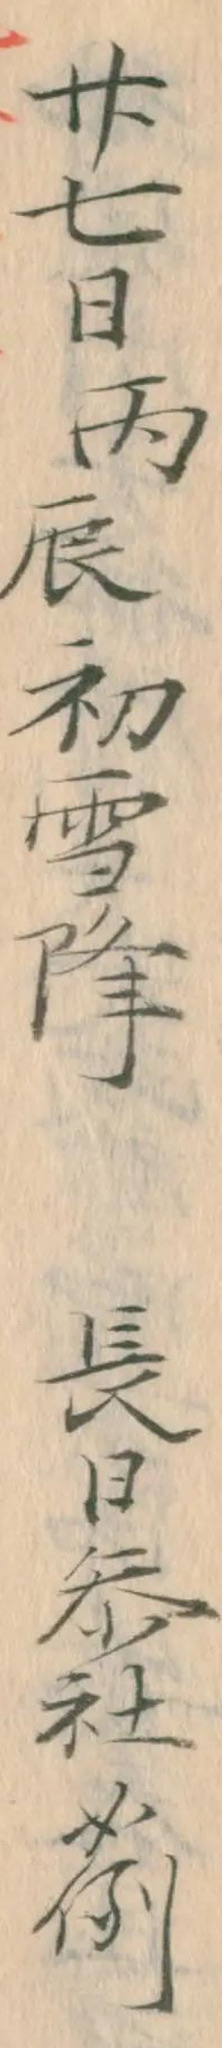廿七日丙辰初雪降長日参社如例
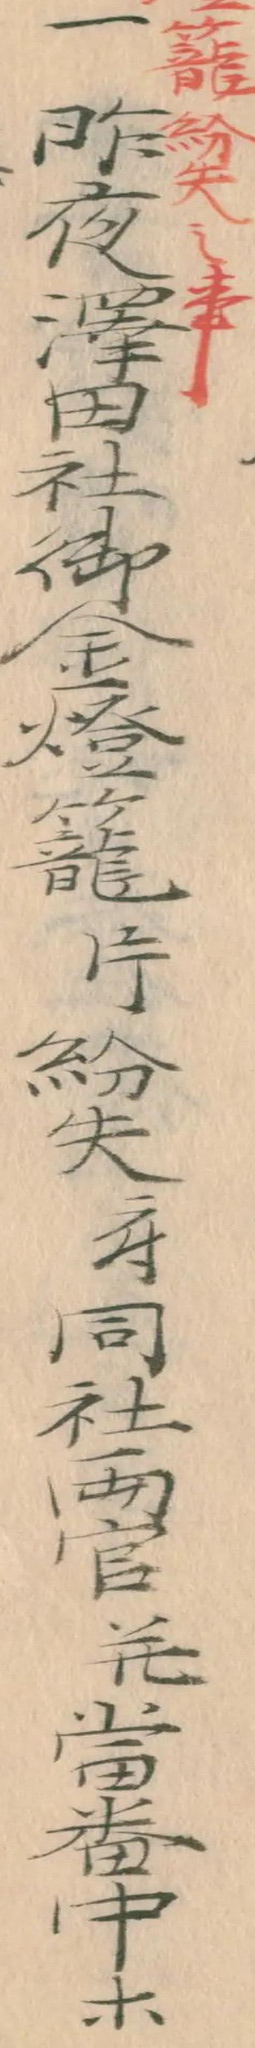一昨夜澤田社御金燈籠片紛失ニ付同社両官并當番中等
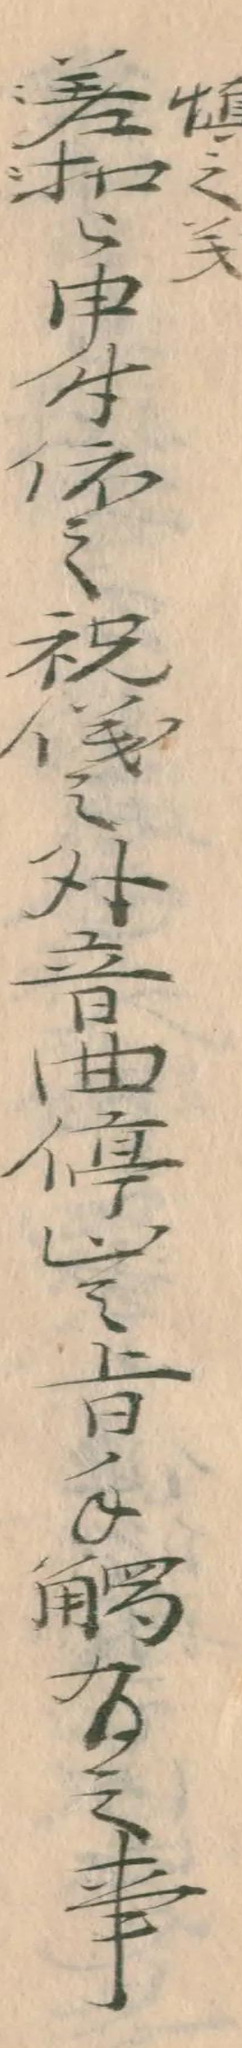慎之義被申付依之祝儀之外音曲停止之旨手觸有之事
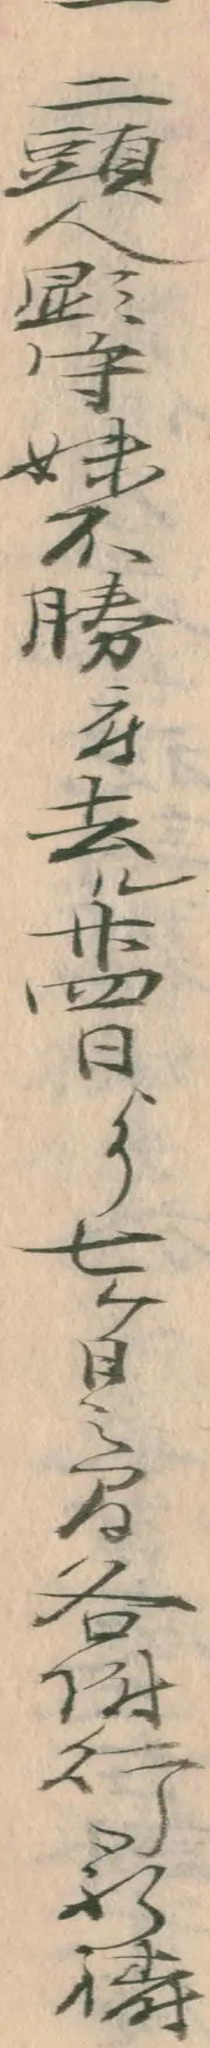一二頭人顕守妹不勝ニ付去ル廿四日より七ヶ日之間各附行御祈祷
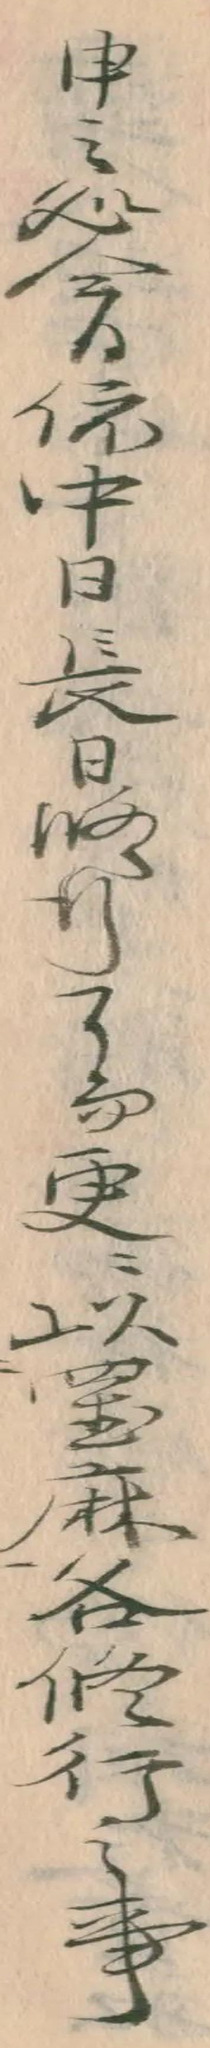申之処今日依中日ニ長日修行了而更ニ以置麻各修行之事
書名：賀茂社記録. 第74冊
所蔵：国立国会図書館 National Diet Library, JAPAN
